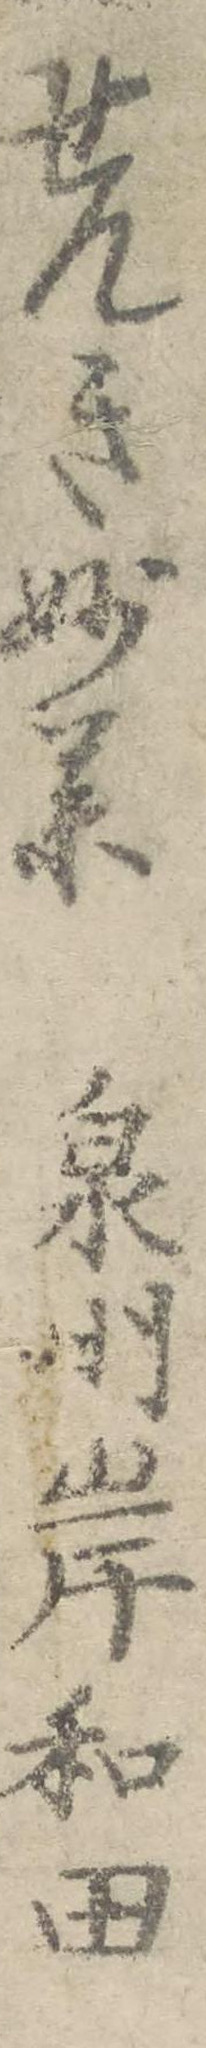せんき妙薬泉州岸和田
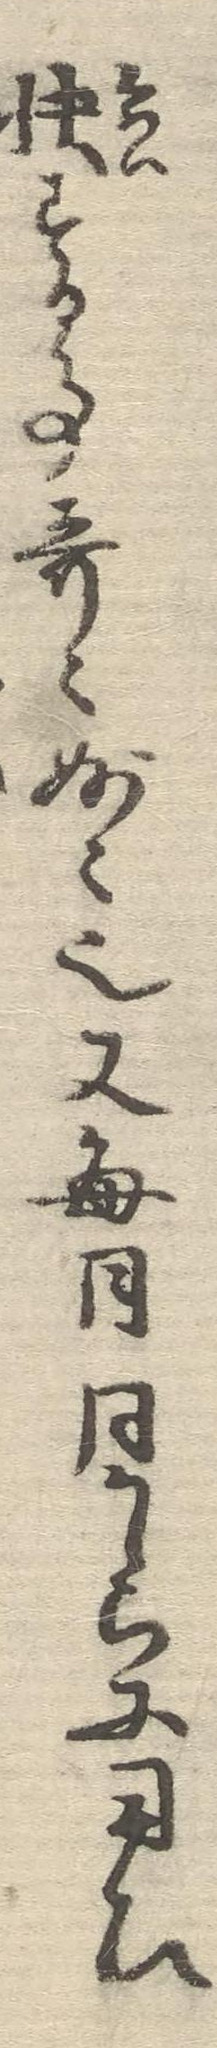快する事奇々妙々也又毎月月かしらに用ひ
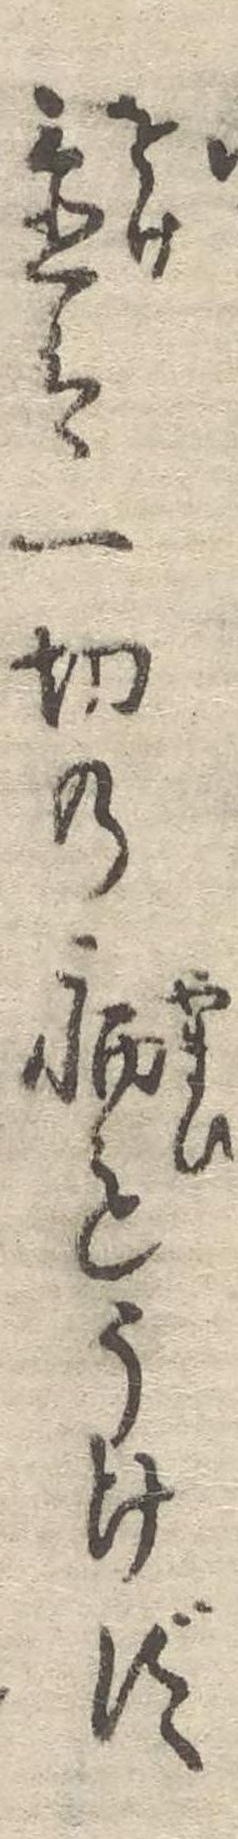置は一切の病うけず
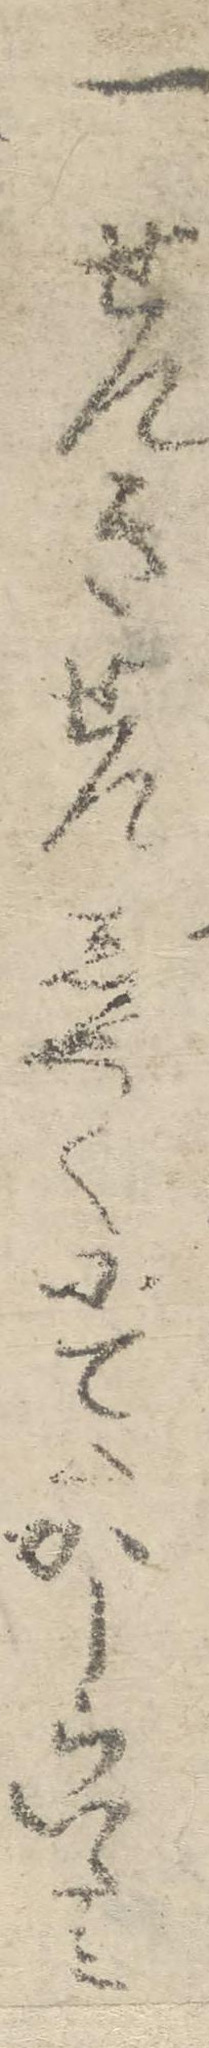一せんきせんしやくにて△かしらいたみ
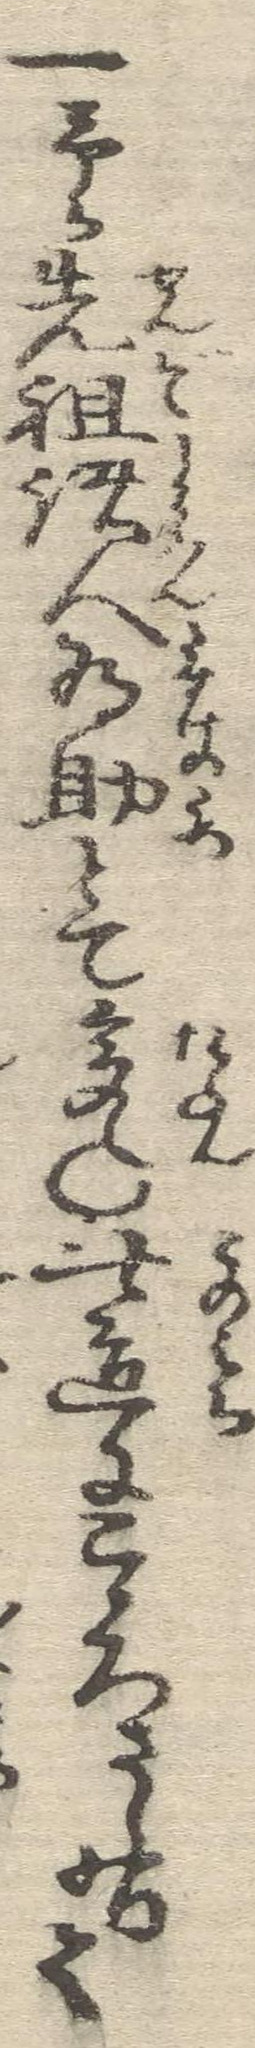一予か先祖諸人為助とて多年此道にこゝろさし有て
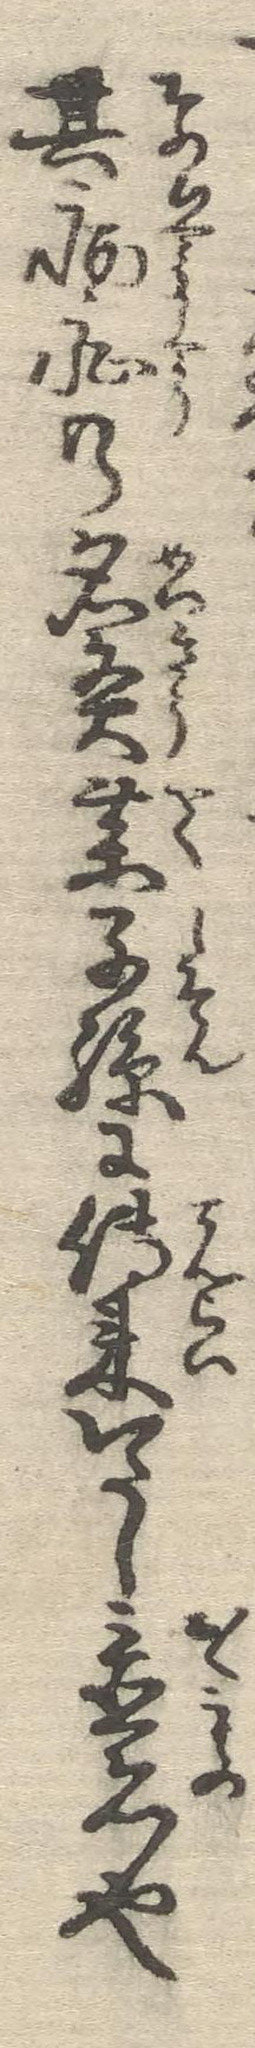其病症の名灸薬子孫に伝来いたし置者也
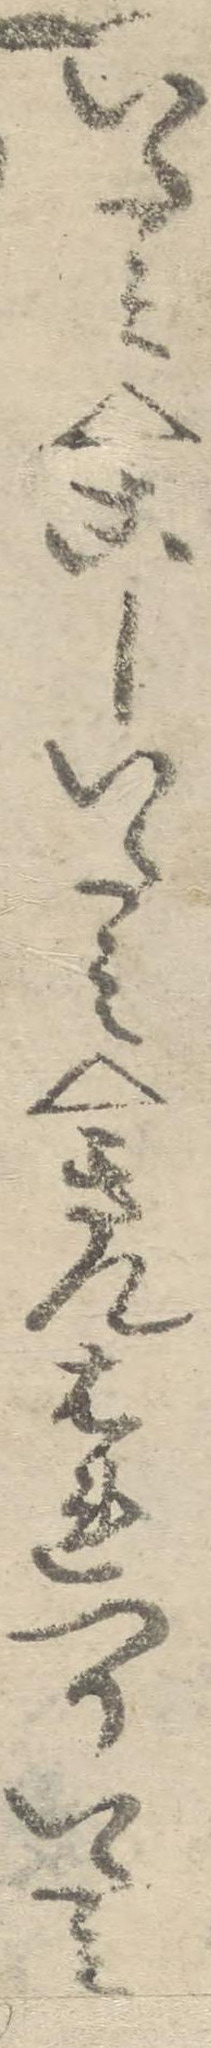いたみ△こしいたみ△きんはれつりいたみ
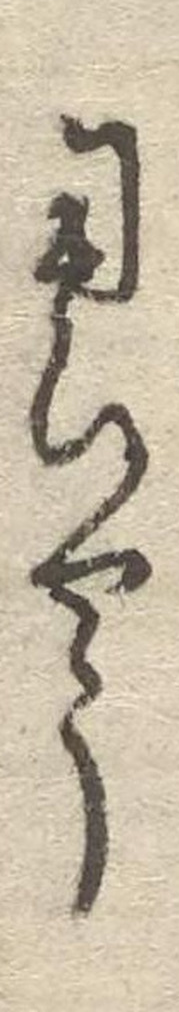用ひやう
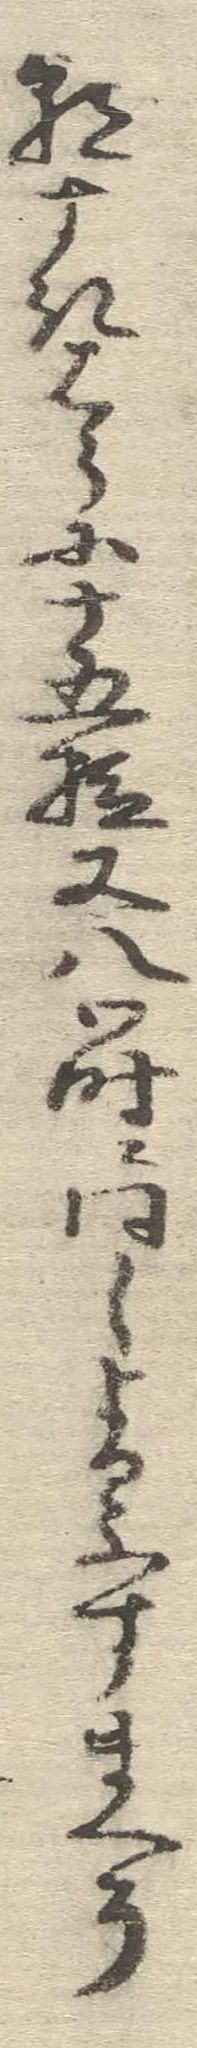朝すきはらに十五粒又八ツ時に同しよるふすまへに
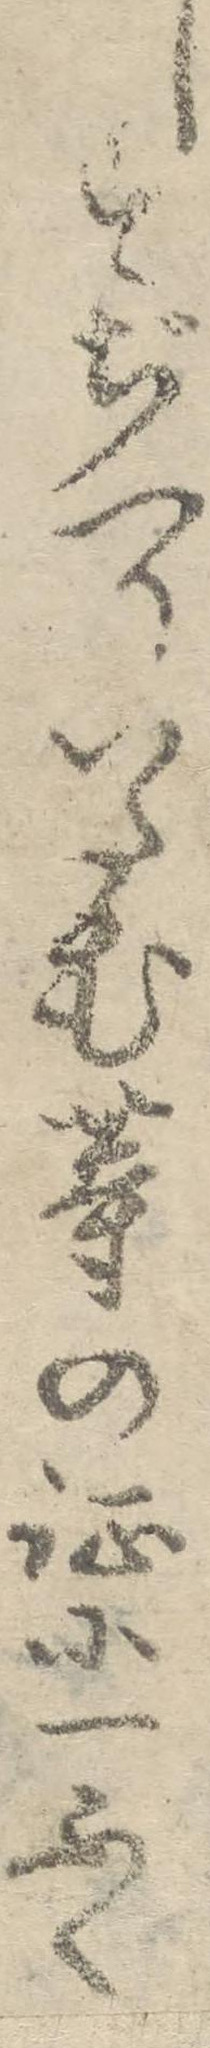あしすぢつりいたむ等の証に一ふく
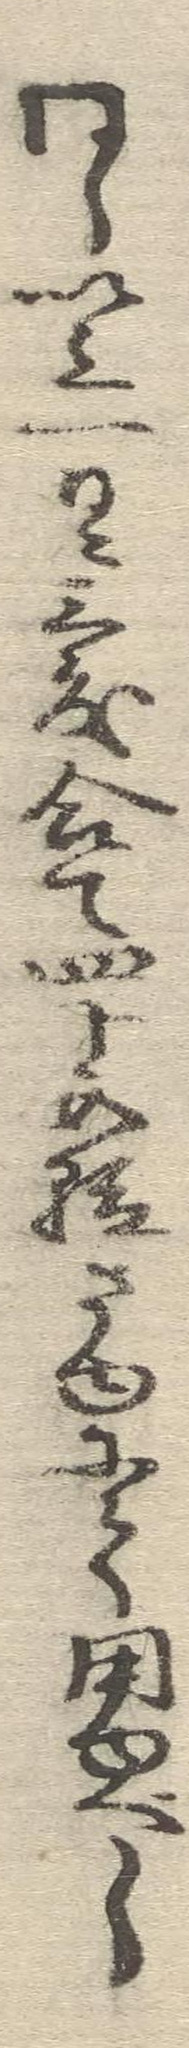同し以上一日に三度合て四十五粒さゆにて用ゆべし
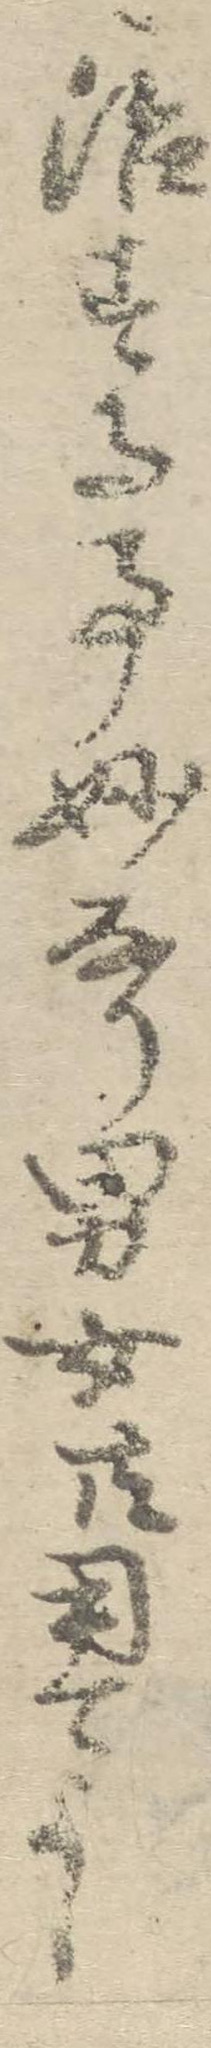にて治する事妙なり男女共用てよし
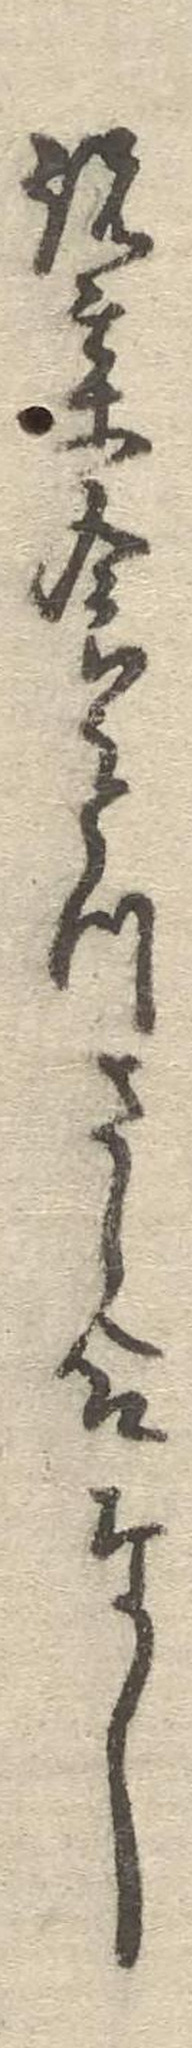諸薬食もつさし合なし
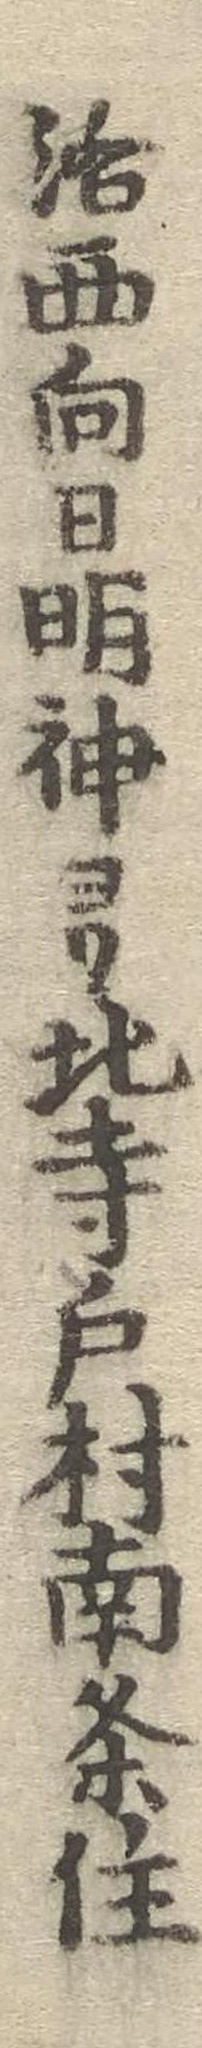洛西向日明神北寺戸村南条住
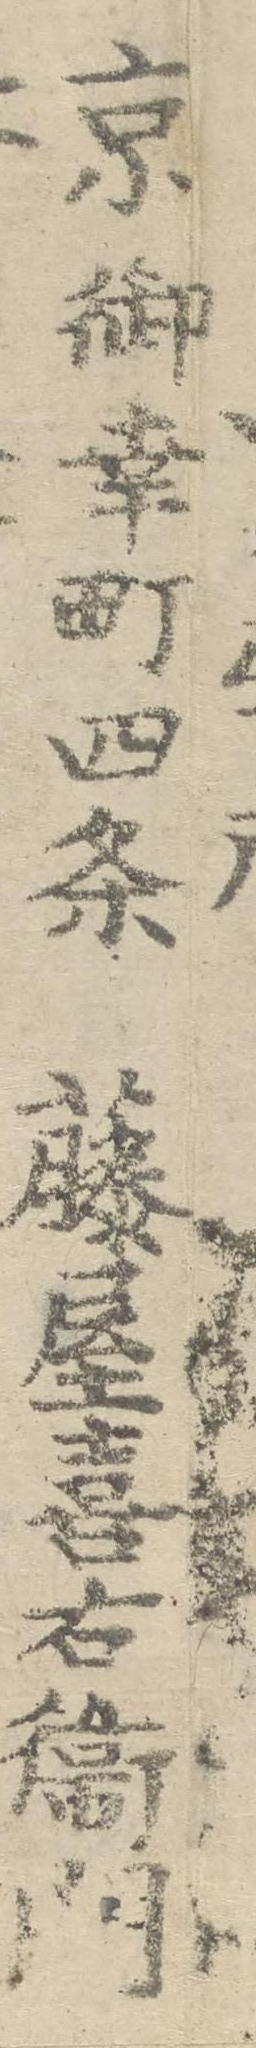京御幸町四条藤屋喜右衛門
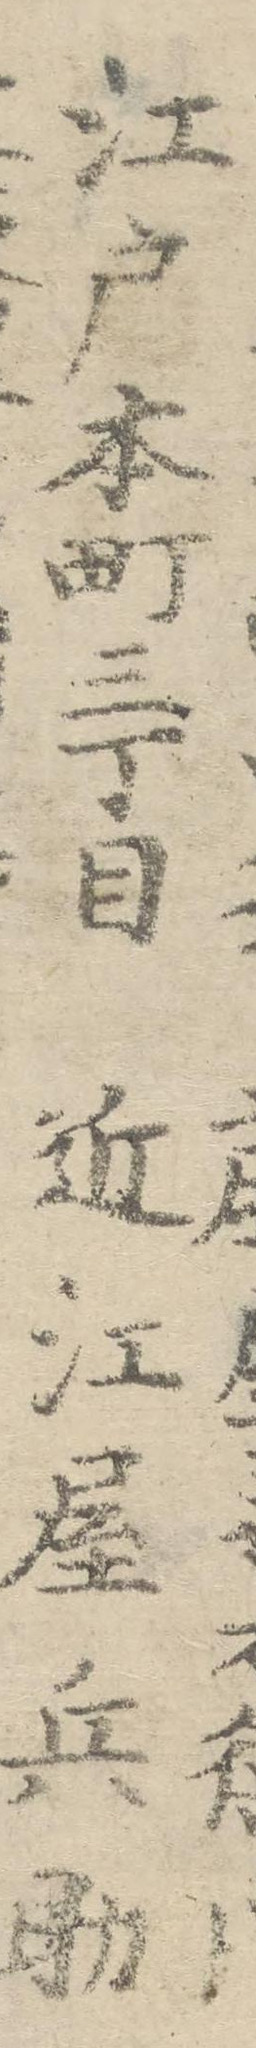江戸本町三丁目近江屋兵助
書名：浪華薬種問屋能書張交帖. 二
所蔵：国立国会図書館 National Diet Library, JAPAN
